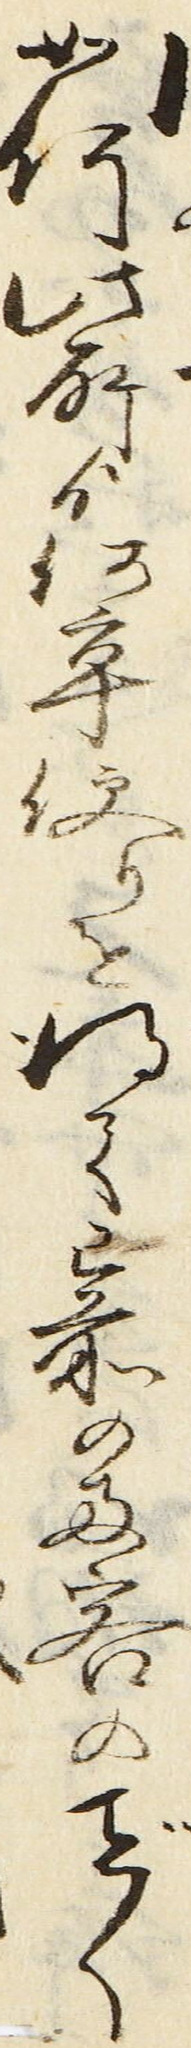如何此所ゟ何卒便りを得て已前の両客のごとく
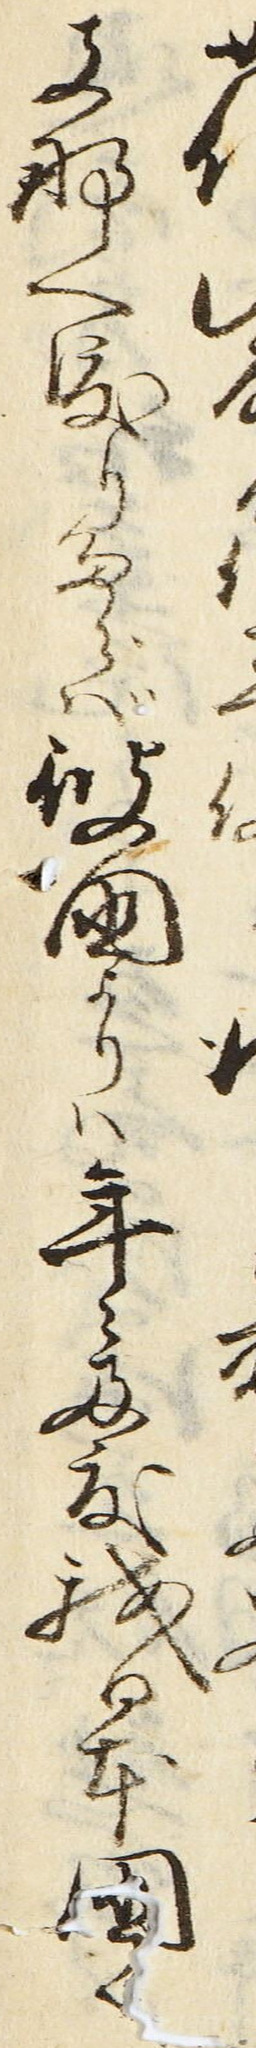支那へ渡りたらバ彼国よりハ年々両度我日本国へ

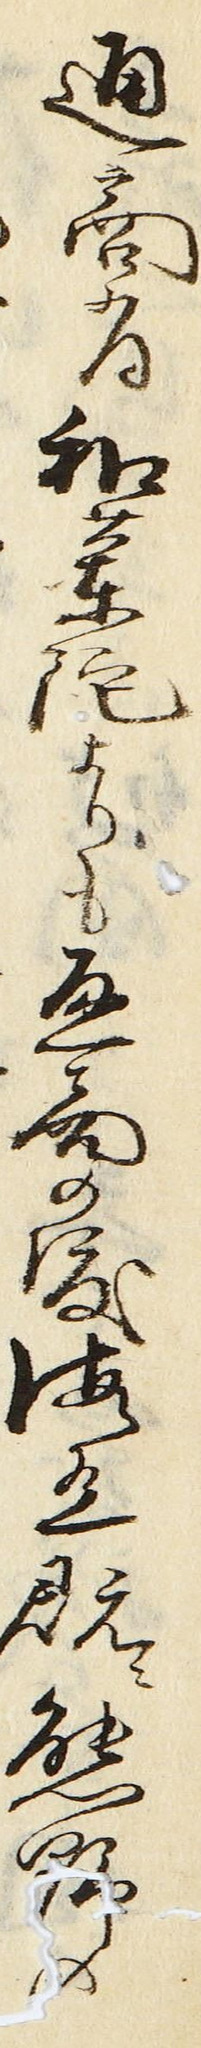通商有和蘭陀よりも通商の渡海有既ニ熊野の
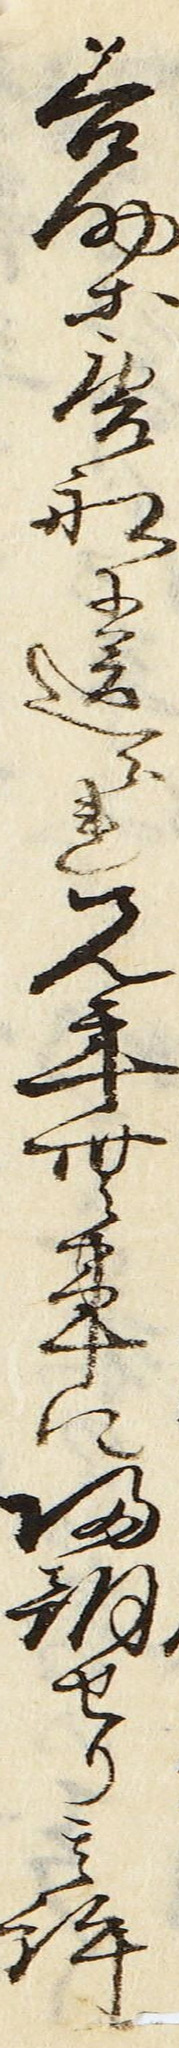善助等唐船に送られ先年無事に帰朝せり其許
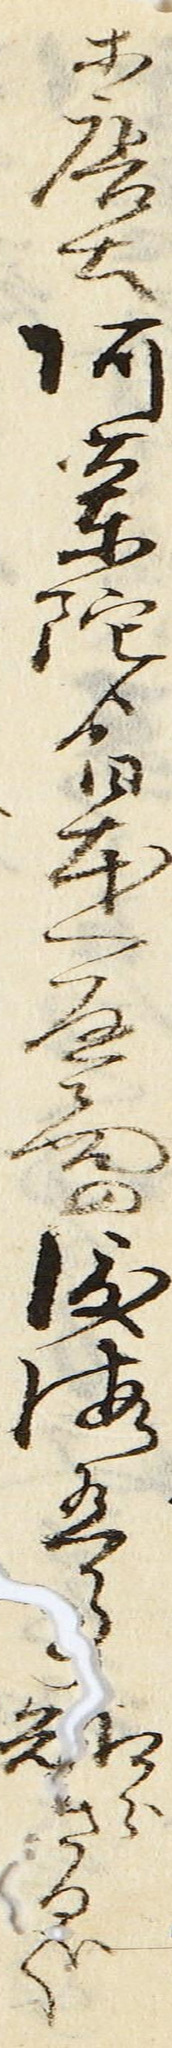等唐土阿蘭陀ゟ日本へ通商の渡海有事知らさる哉
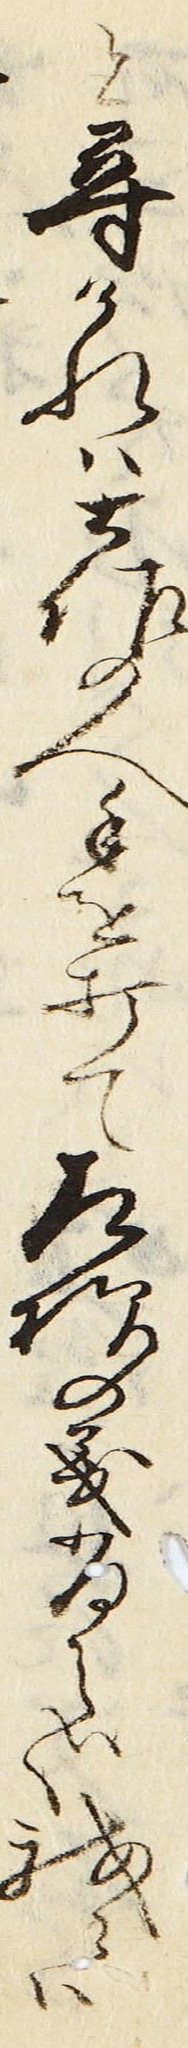と尋けれハ土佐の人手を打て左様の義有し哉我々ハ
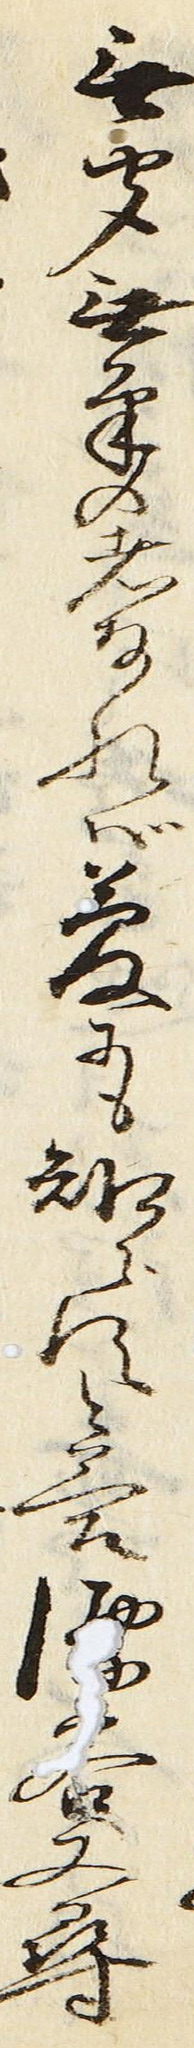無聞無筆の者なれバ夢にも知らすと答漂客又尋
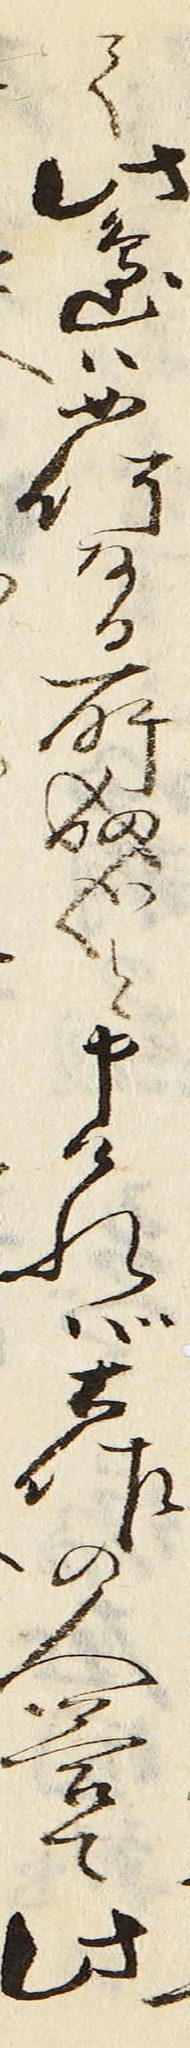て此島ハ如何なる所成哉と申けれバ土佐の人答て此
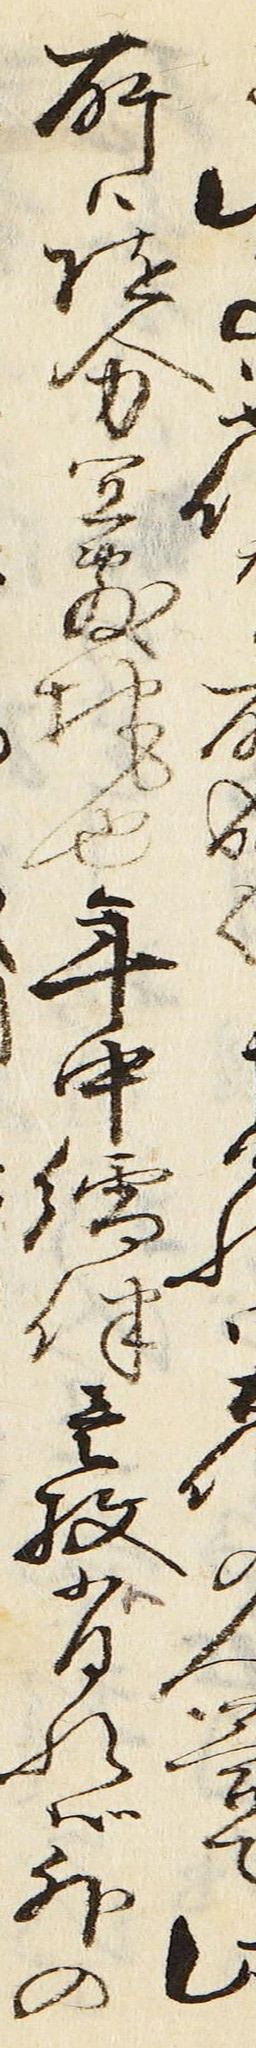所ハ随分宜敷地也年繻伴壱枚有れバ外の
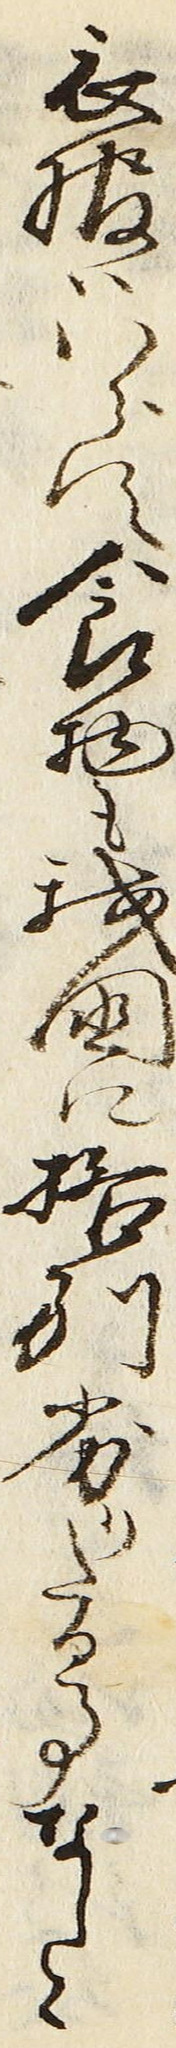衣服ハいらす食物も我国に格別劣りたる事なしと
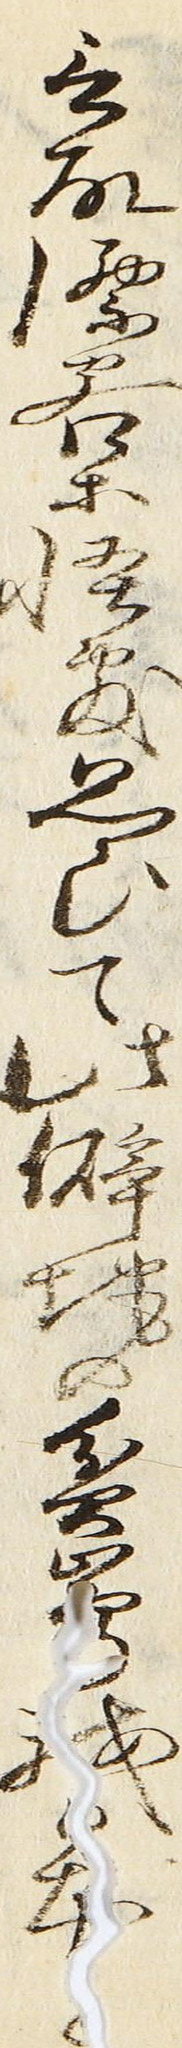言故漂客等怪敷思ひて此僻地の貧島我日本と
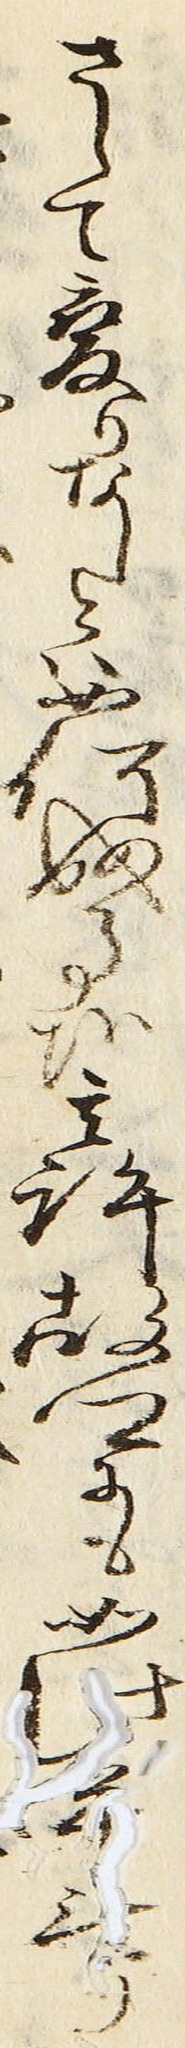さして変りなしとハ如何成事哉其許故郷にも如此芋計り
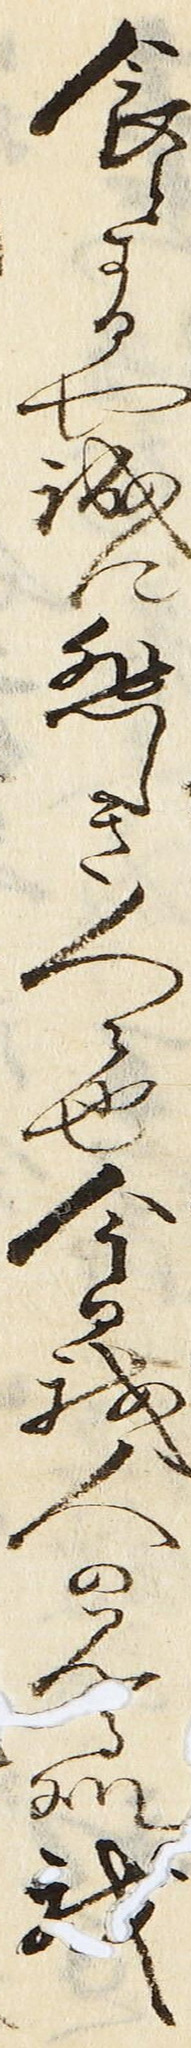食ニするや誠に悲しき人々也今日我人の見る処我
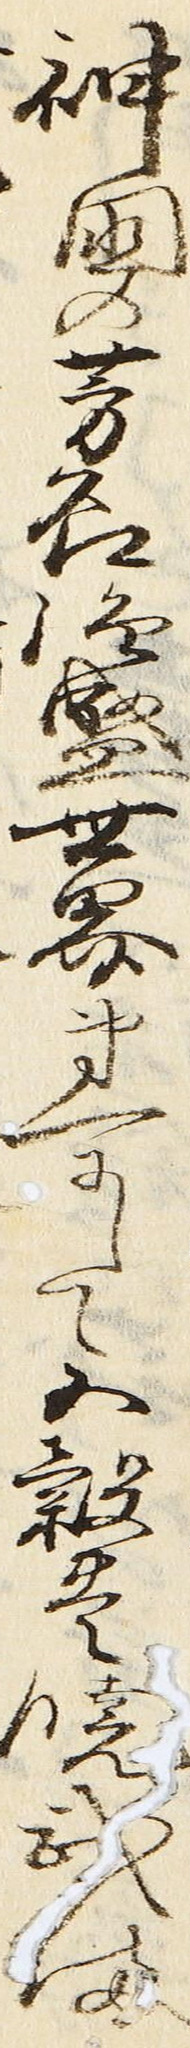神国の芳名強盛世界第一にして五穀豊饒武備
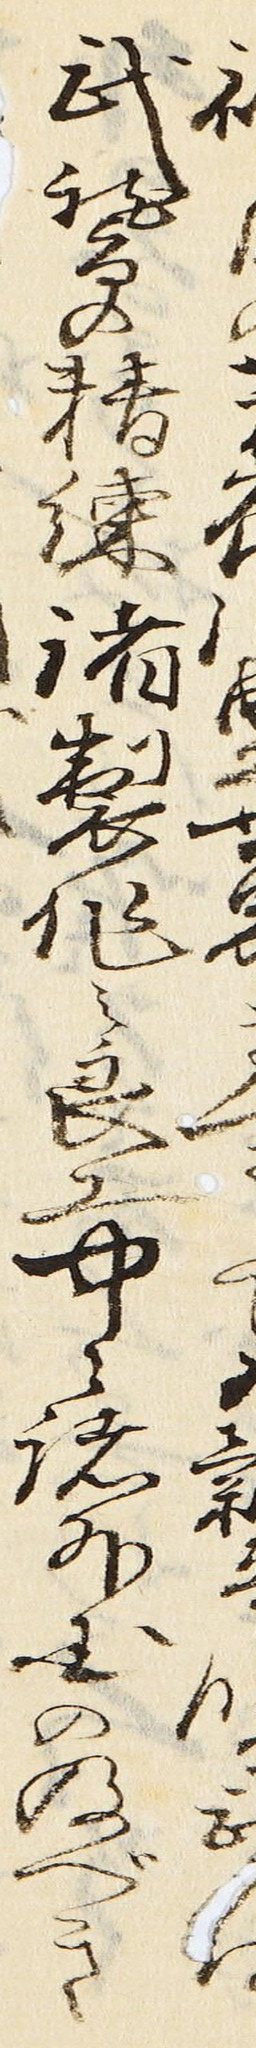武稽の精練諸製作之良工中々諸外国の及べき
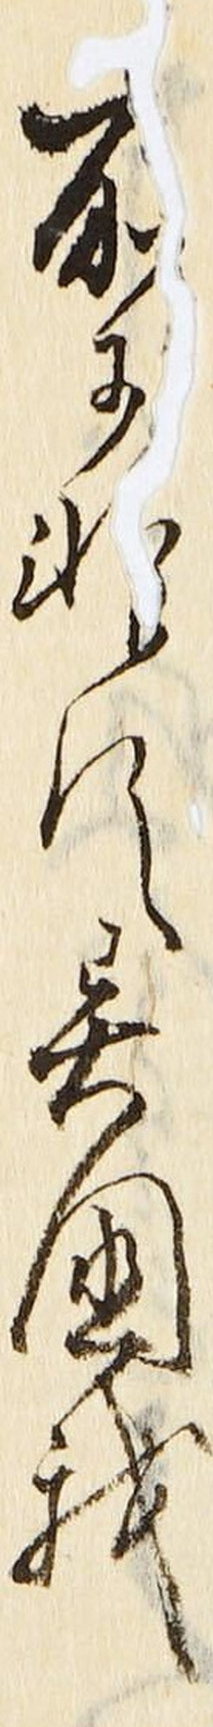所に非す異国我
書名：亜墨利加漂流記聞
